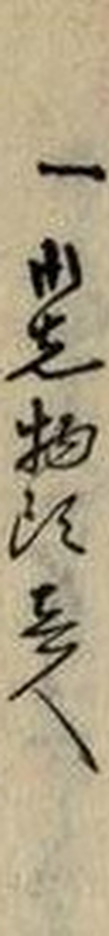一御先物頭壱人
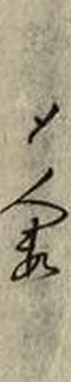〆人数
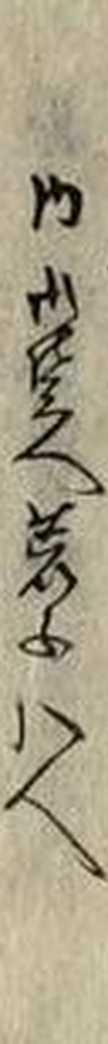内御貸人荒子八人
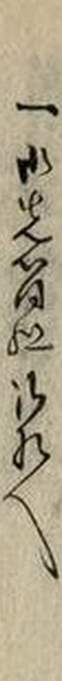一御先筒組弐拾人
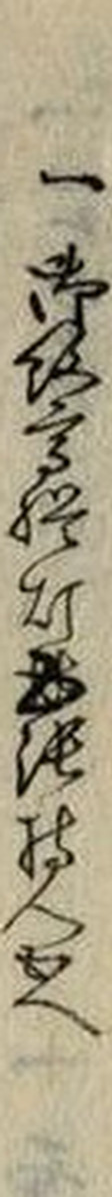一御紋高提灯五張持人五人
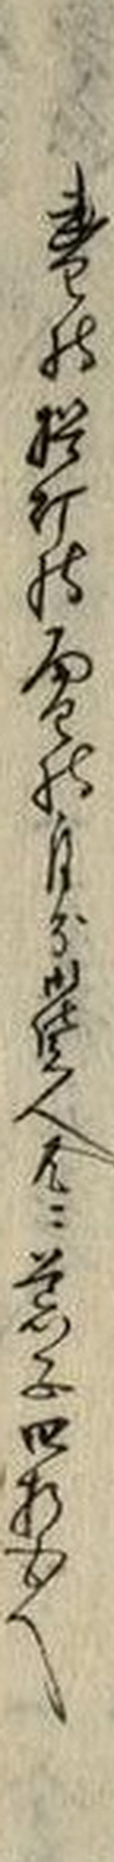武具持提灯持雨具持自分御貸人共ニ荒子四拾五人
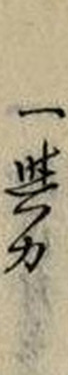一与力
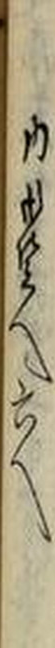内御貸人六人
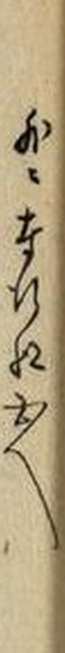外ニ奉行組五人
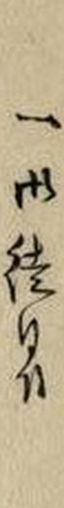一御徒目付
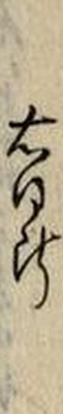右同断
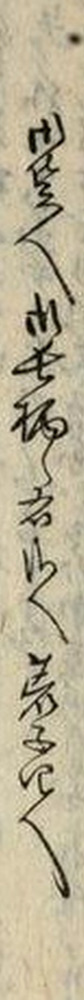御貸人御長柄之者弐人荒子四人
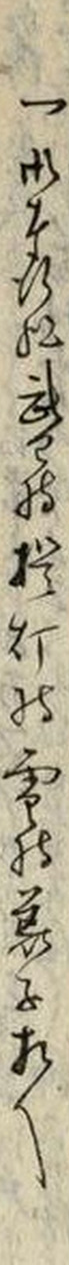一御奉行組武具持提灯持雨具持荒子拾人
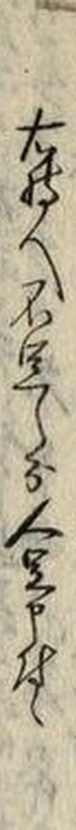右持人不足之分人足申付候
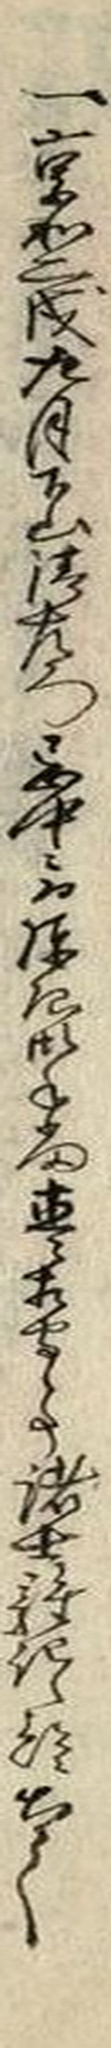一享和二戌九月下山清左衛門忌中ニ而陣屋御手当直ニ相守候事諸士雑記之部ニ出之
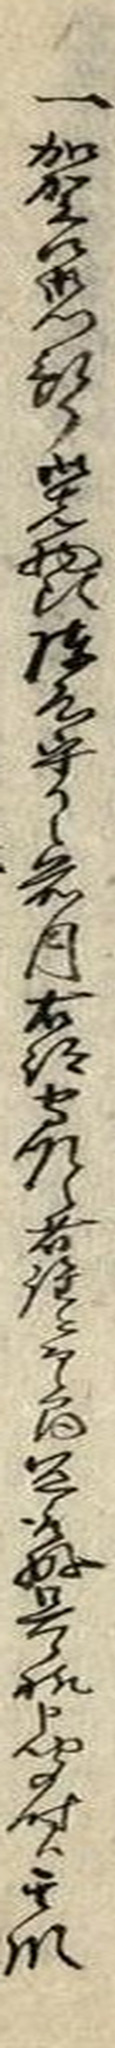一加賀口御門預り御先物頭陣屋守り之前月右跡守順之者誰ニ而之間宜取扱呉候様申聞時ハ其段
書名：御国他国諸事之部
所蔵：福井県文書館 Fukui Prefectural Archives
